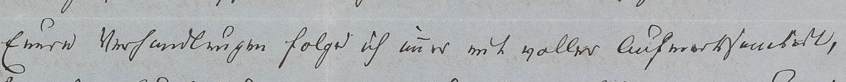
Euern Verhandlungen folge ich immer mit voller Aufmerkamkeit,
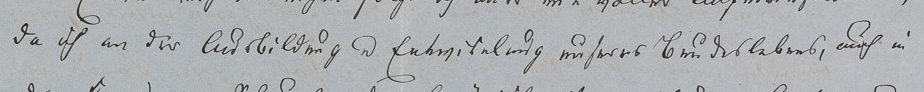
da ich an der Ausbildung & Entwikelung unseres Bundeslebens, auch in
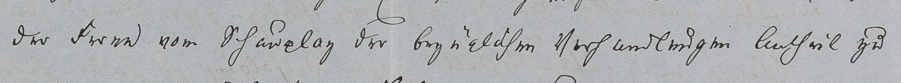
der Ferne vom Schauplaz der bezüglichen Verhandlungen Antheil zu
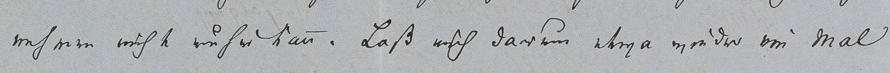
nehmen nicht ruhen kann. Laß mich darum etwa wieder ein Mal
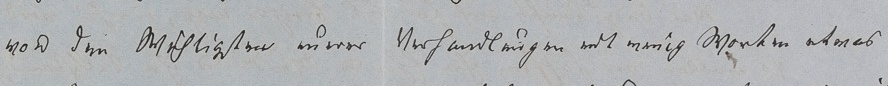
von den Wichtigsten euerer Verhandlungen mit wenig Worten etwas
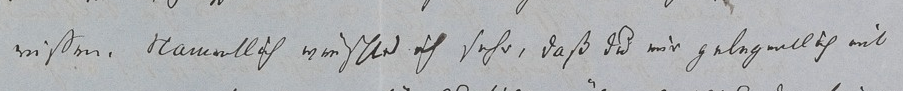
wissen. Namentlich wünschte ich sehr, daß du mir gelegentlich mit
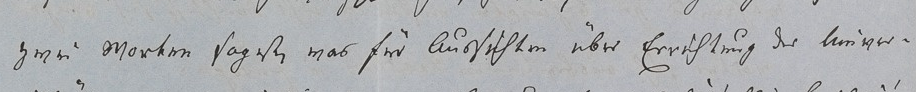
zwei Worten sagest, was für Aussichten über Errichtung der Univer-
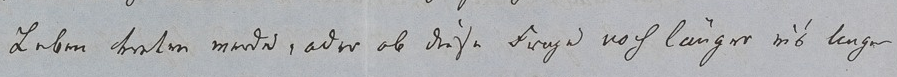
Leben treten werde, oder ob diese Frage noch länger in's Unge-
